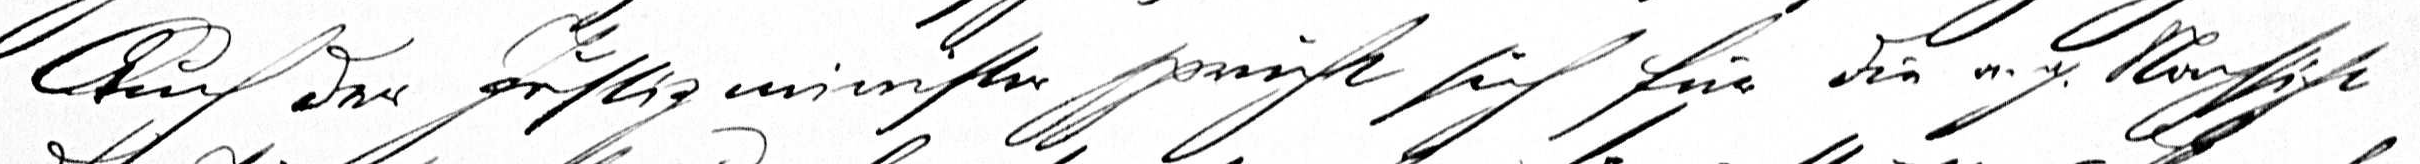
Auch der Justizminister spricht sich für die a.g. Nachsicht
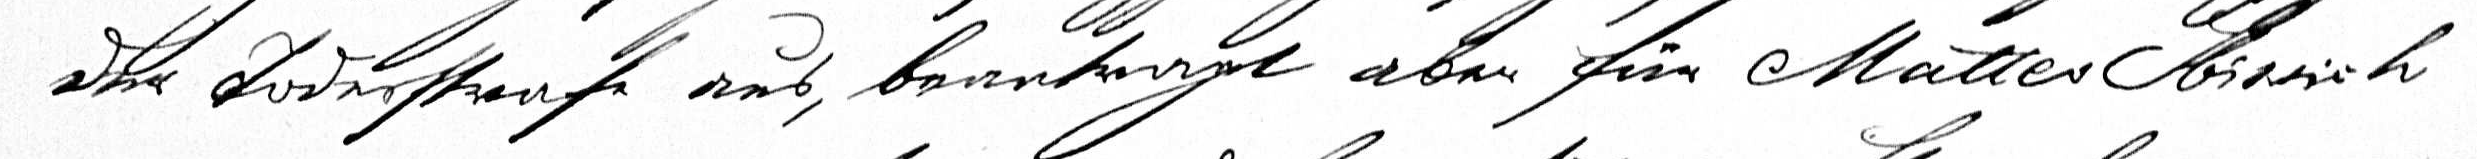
der Todesstrafe aus, beantragt aber für Matteo Sbissich
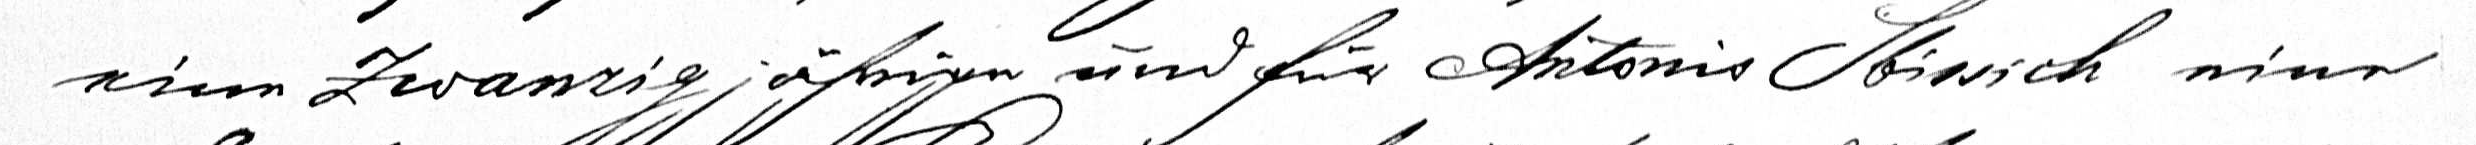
einen zwanzigjährigen und für Antonio Sbissich eine
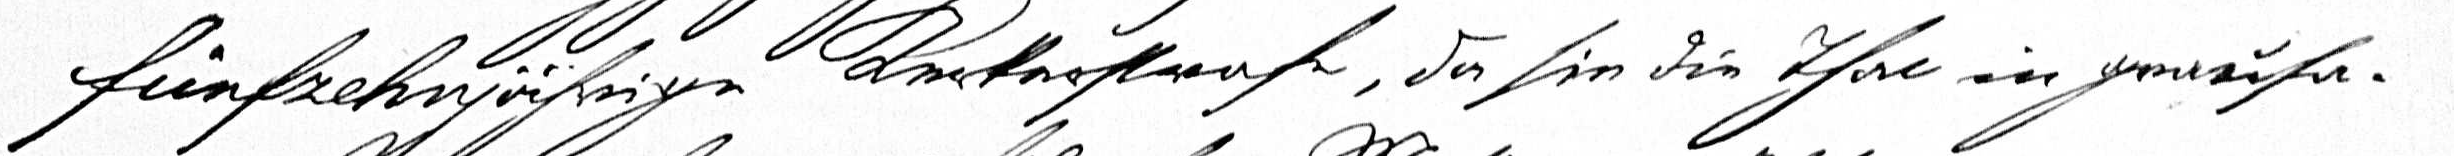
fünfzehnjährigen Kerkerstrafe, da sie die That in grausa¬
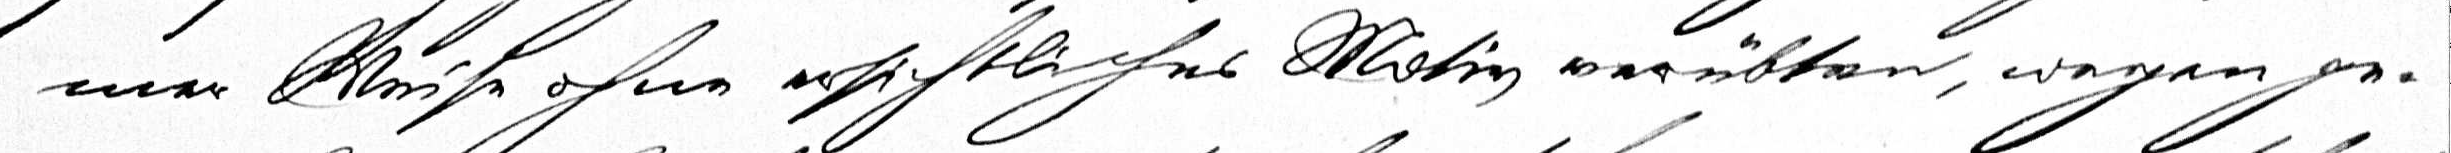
mer Weise ohne ersichtliches Motiv verübten, wegen ge¬
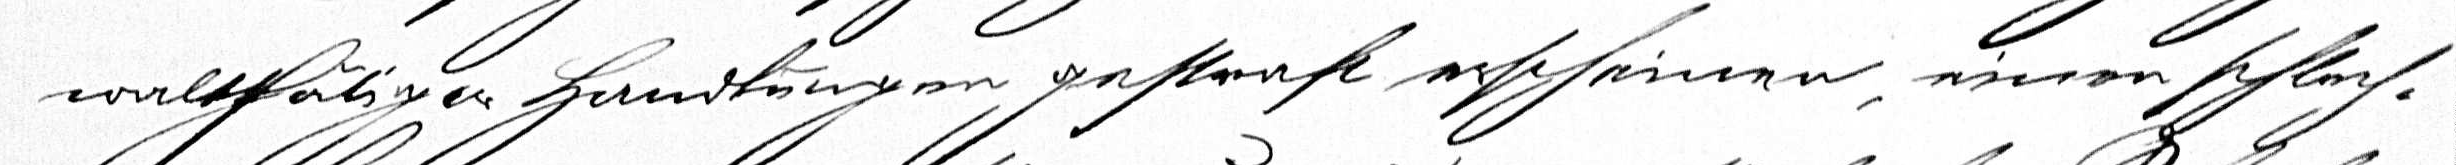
waltthätiger Handlugnen gestraft erscheinen, einen schlech¬
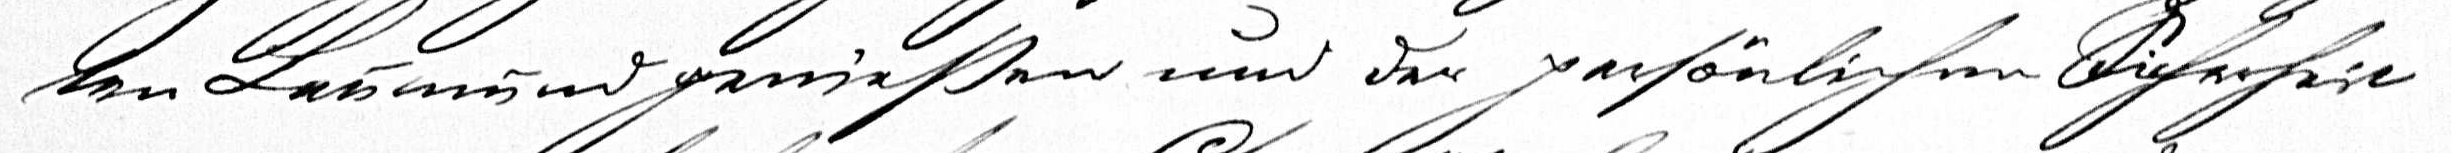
ten Leumund genießen und der persönlichen Sicherheit
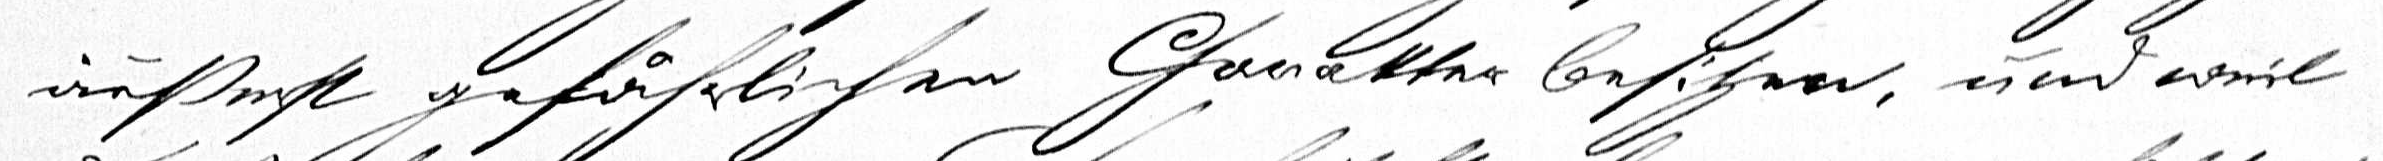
aüßerst gefährlichen Charakter besitzen, und weil
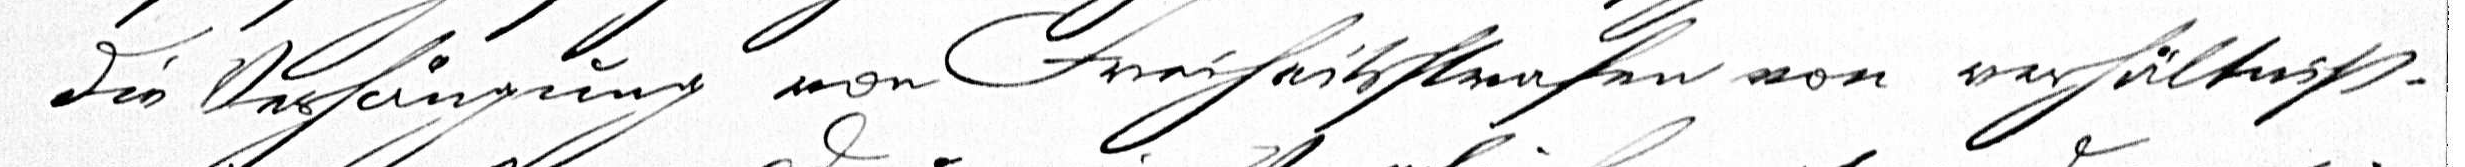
die Verhängung von Freiheitsstrafen von verhältniß¬
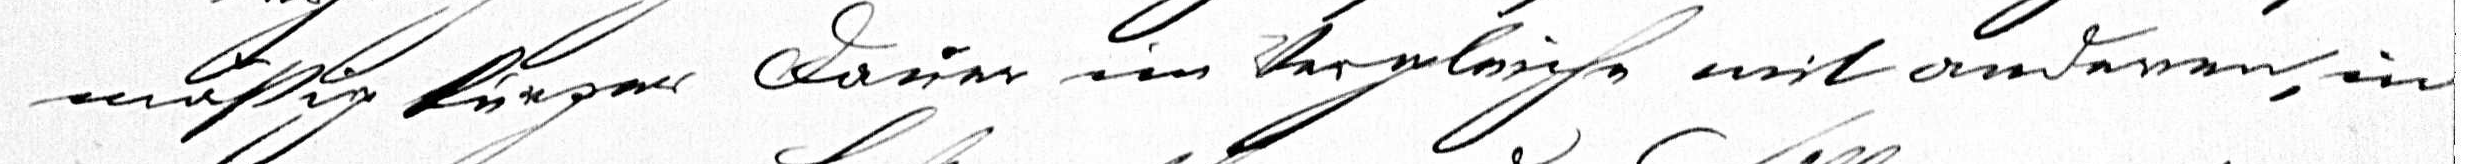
mäßig kürzer Dauer im Vergleiche mit anderen, in
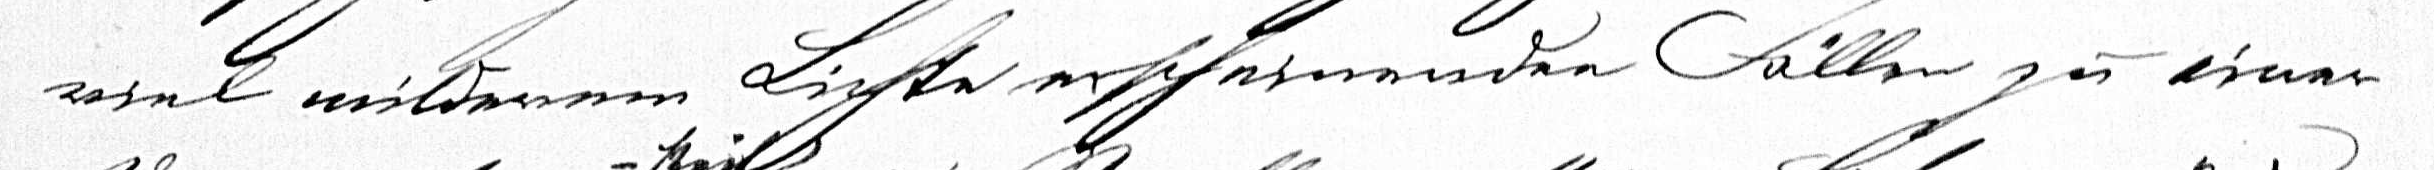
viel milderem Lichte erscheinenden Fällen zu einer
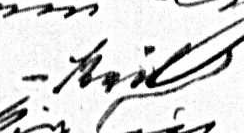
keit
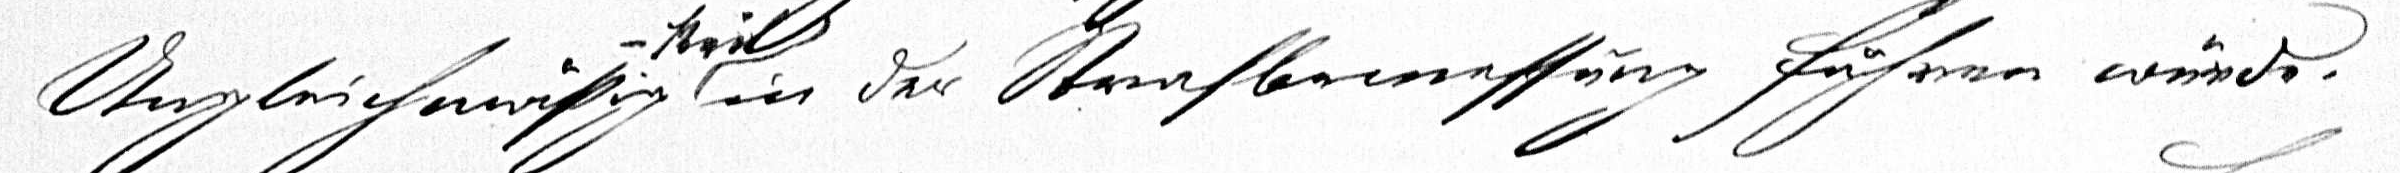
Ungleichmäßig in der Strafbemessung führen würde.
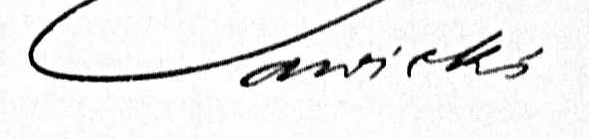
Sawicki
